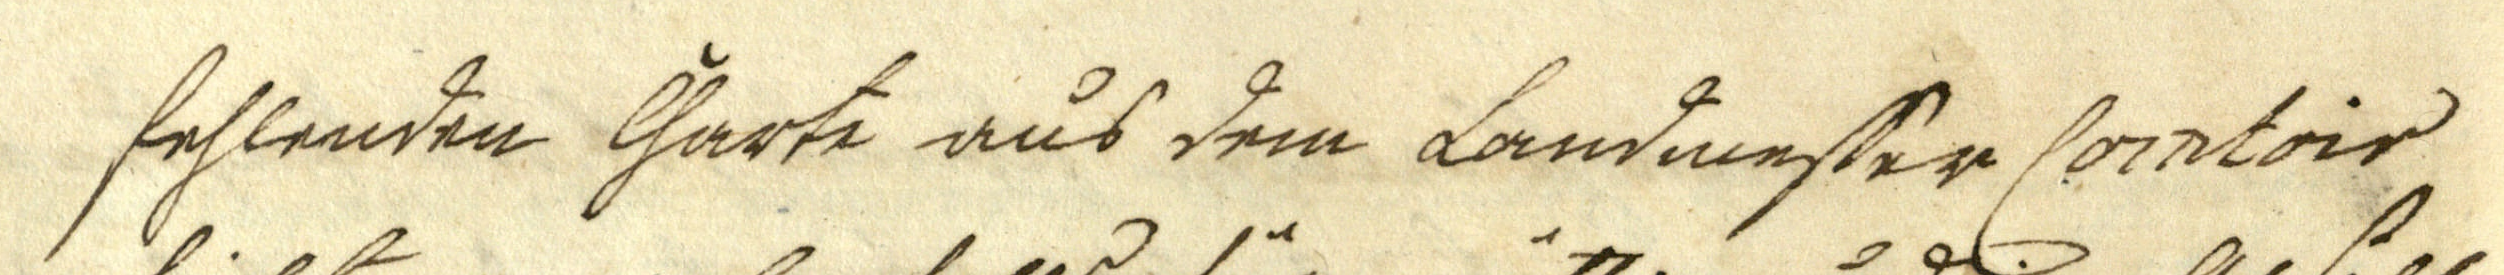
fehlenden Charte aus dem Landmesser Comtoir
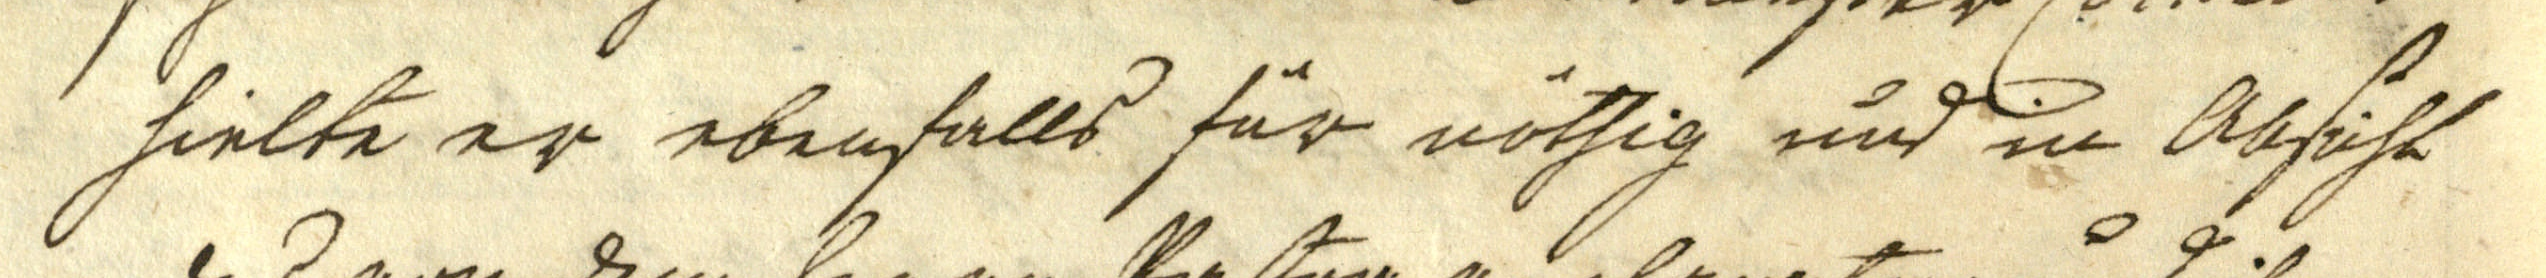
hielte er ebenfalls für nöthig und in Absicht
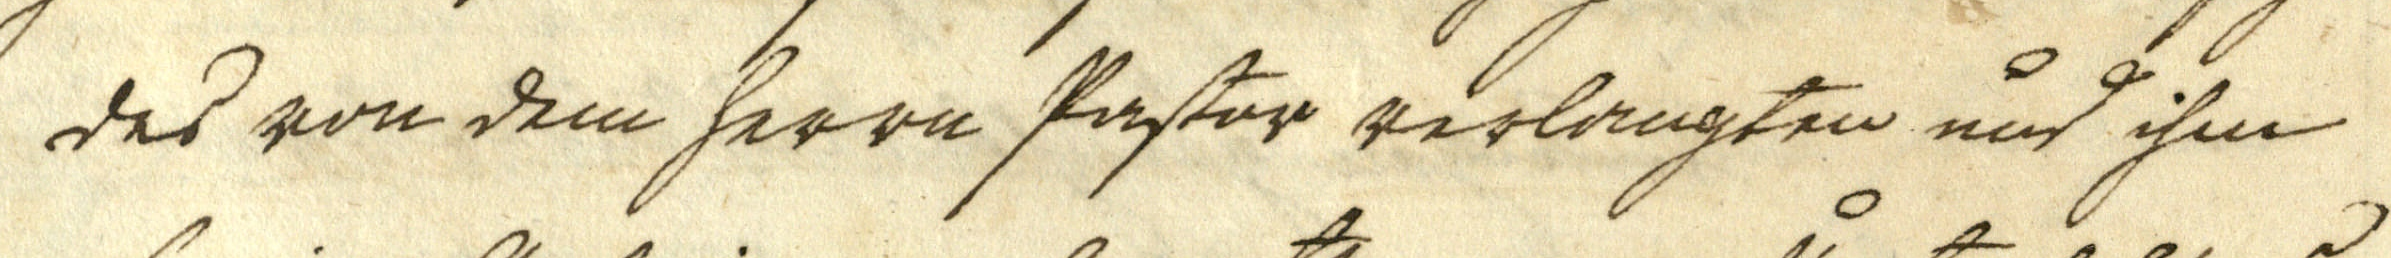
des von dem Herrn Pastor verlangten und ihm
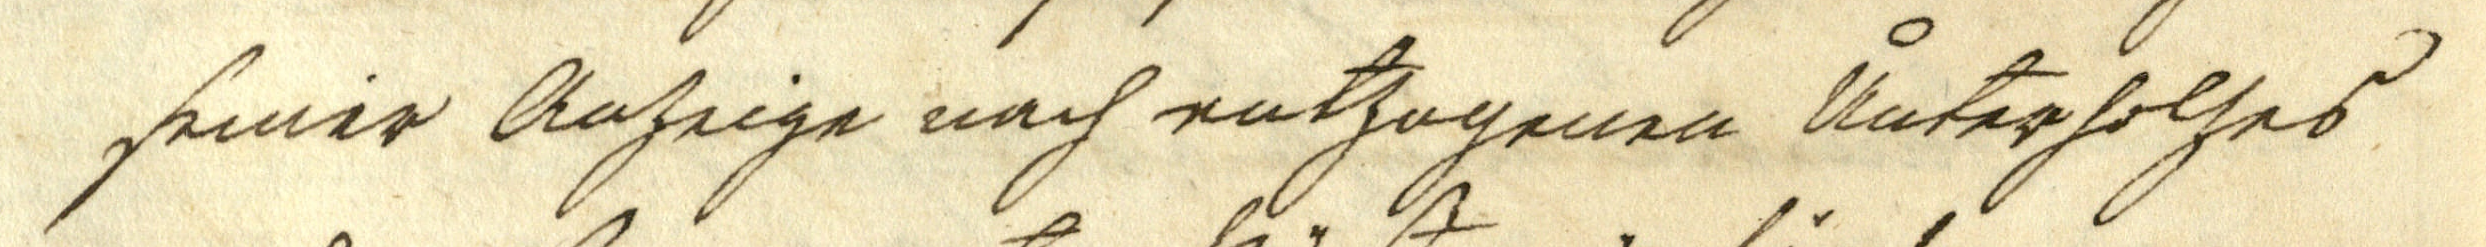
seiner Anzeige nach entzogenen Unterholzes
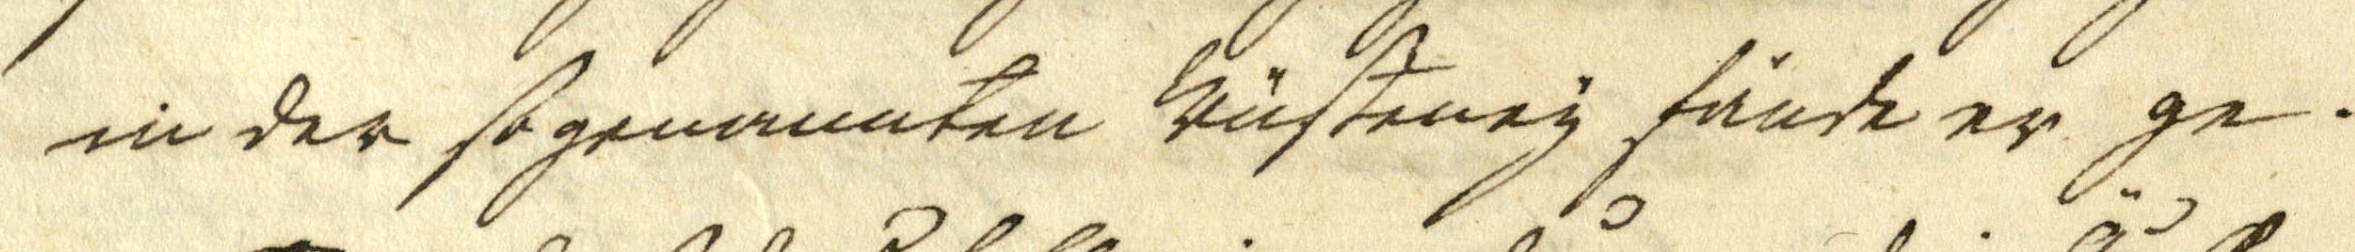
in der sogenannten Wüsteneÿ fände er ge¬
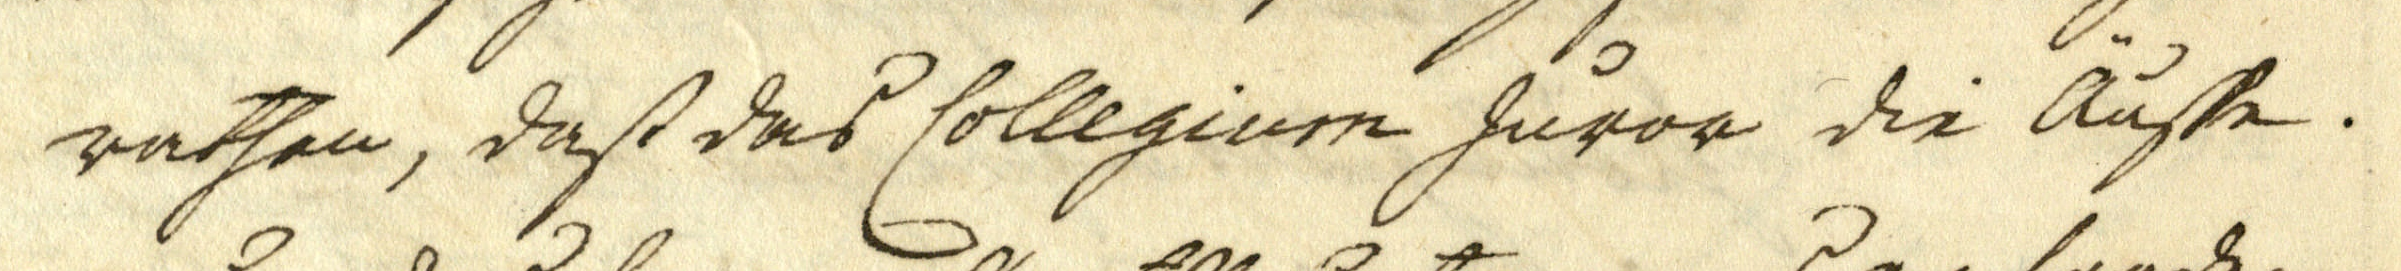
rathen, daß das Collegium zuvor die Äusse¬
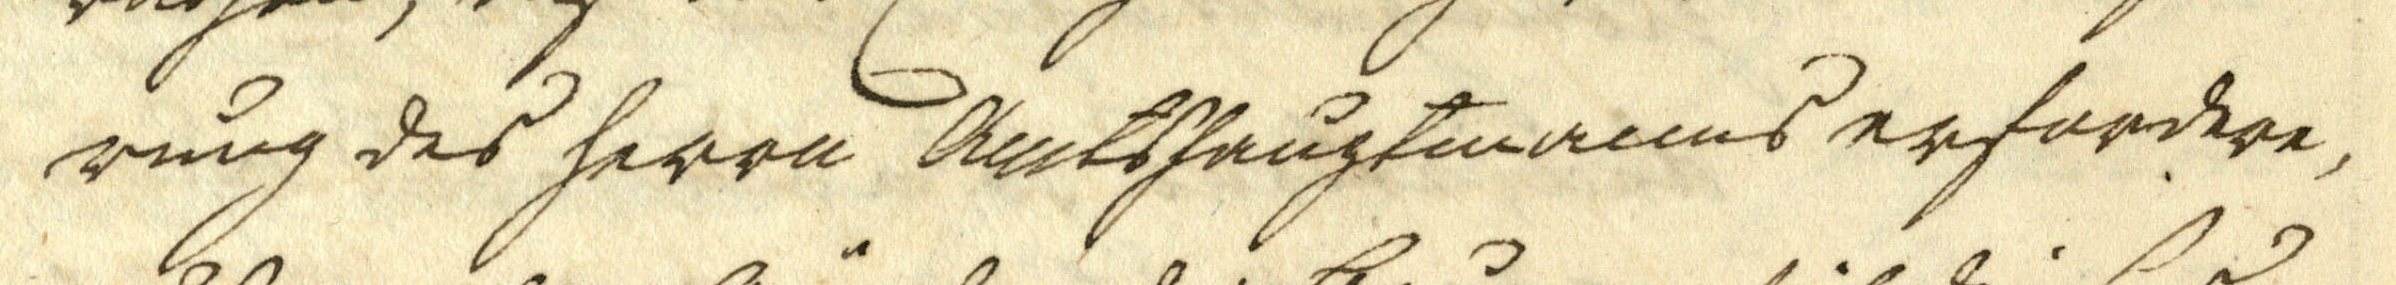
rung des Herrn Amtshauptmanns erfordere,
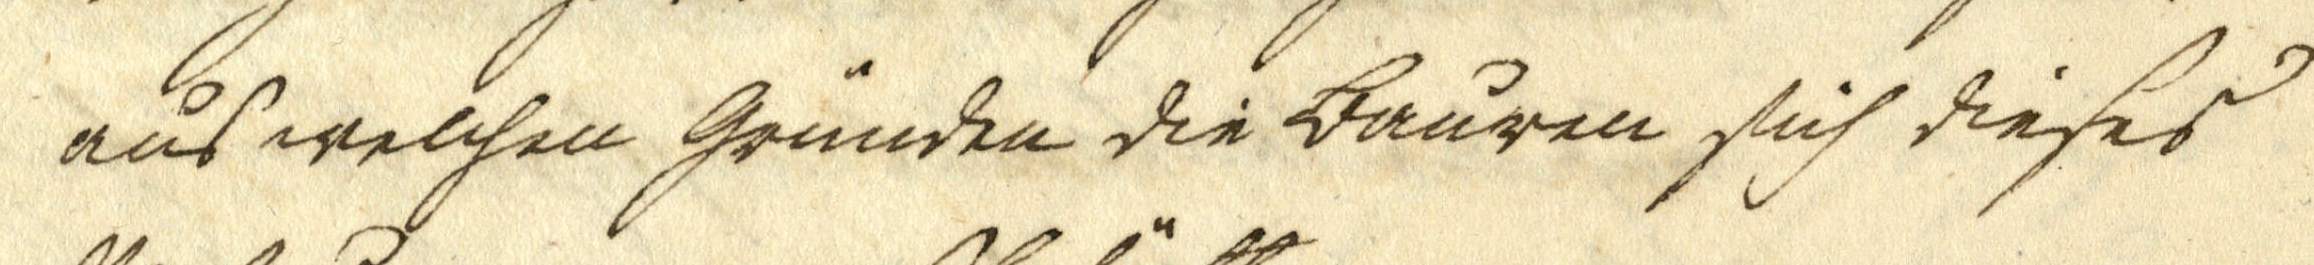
aus welchen Gründen die Bauren sich dieses
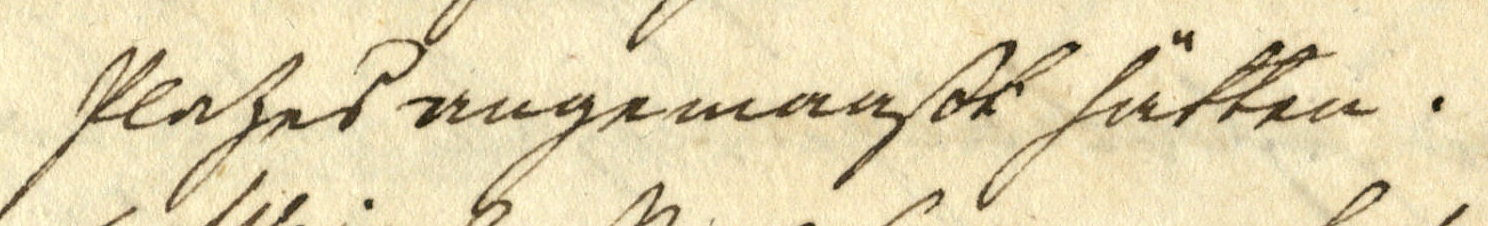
Platzes angemaast hätten.
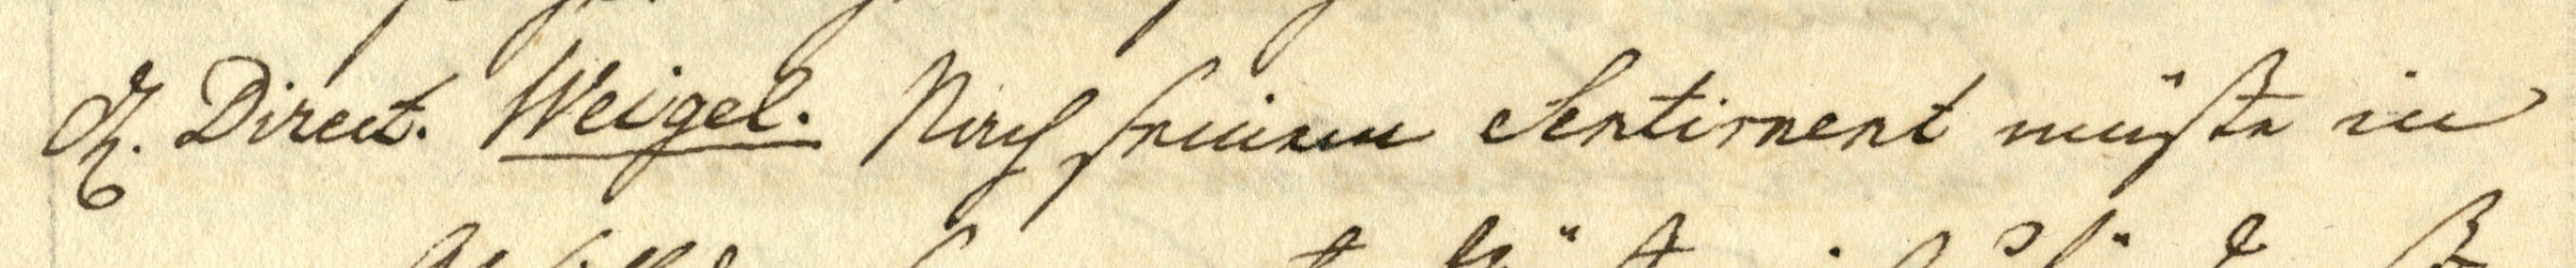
dh. Direct. Weigel. Nach seinem Sentiment müßte in
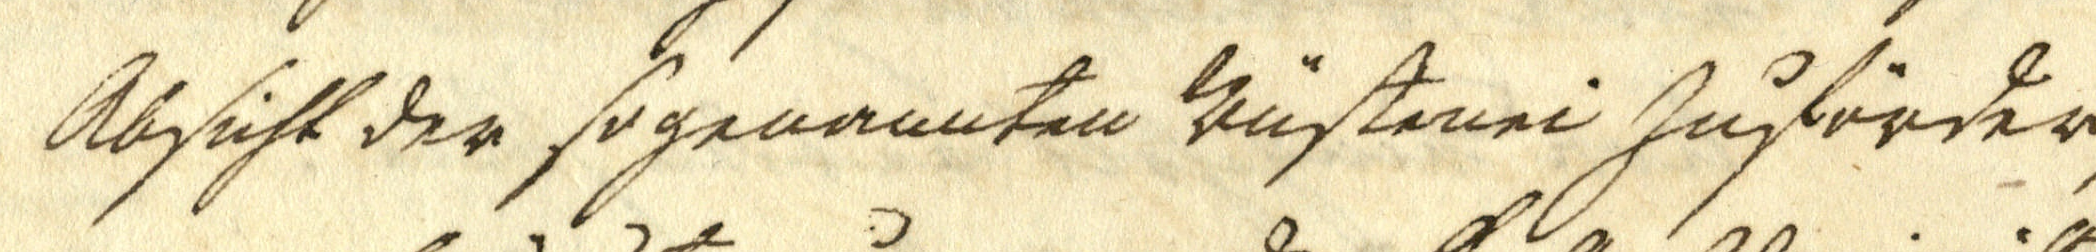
Absicht der sogenannten Wüstenei zuförderst
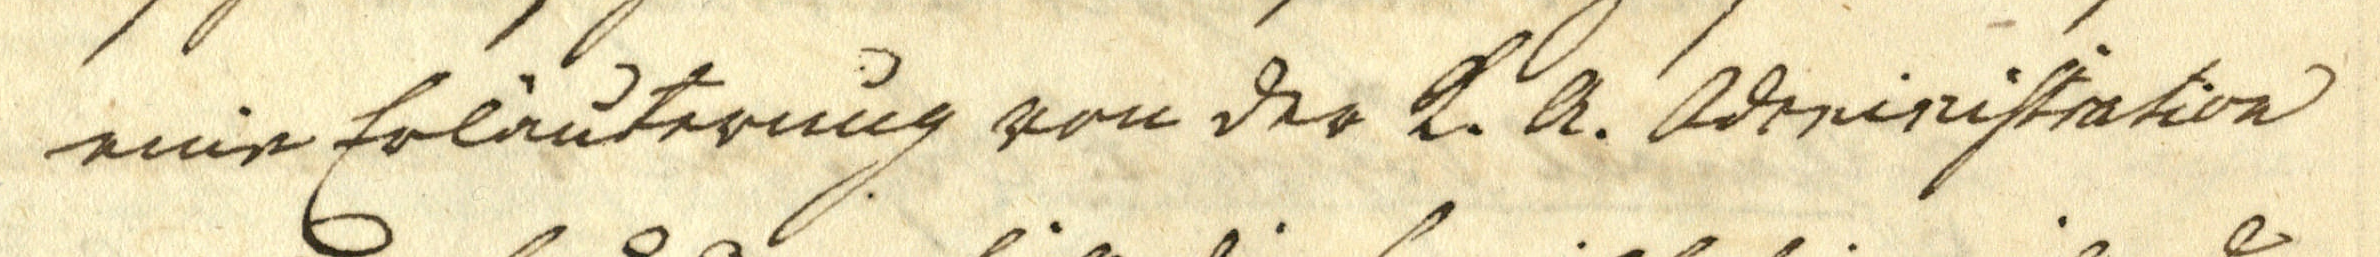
eine Erläuterung von der K. A. Administration
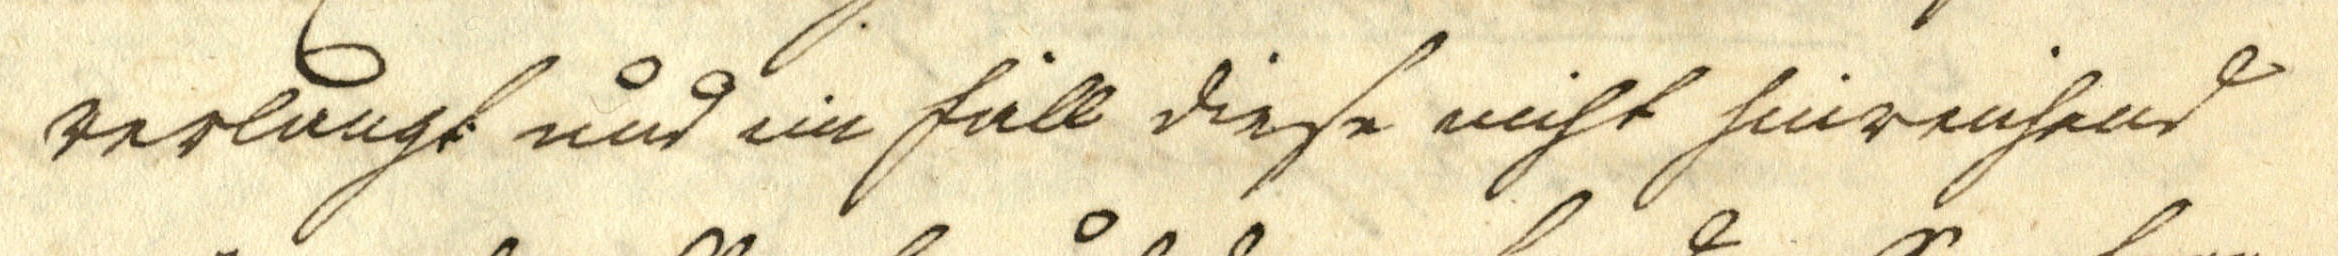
verlangt und im Fall diese nicht hinreichend
